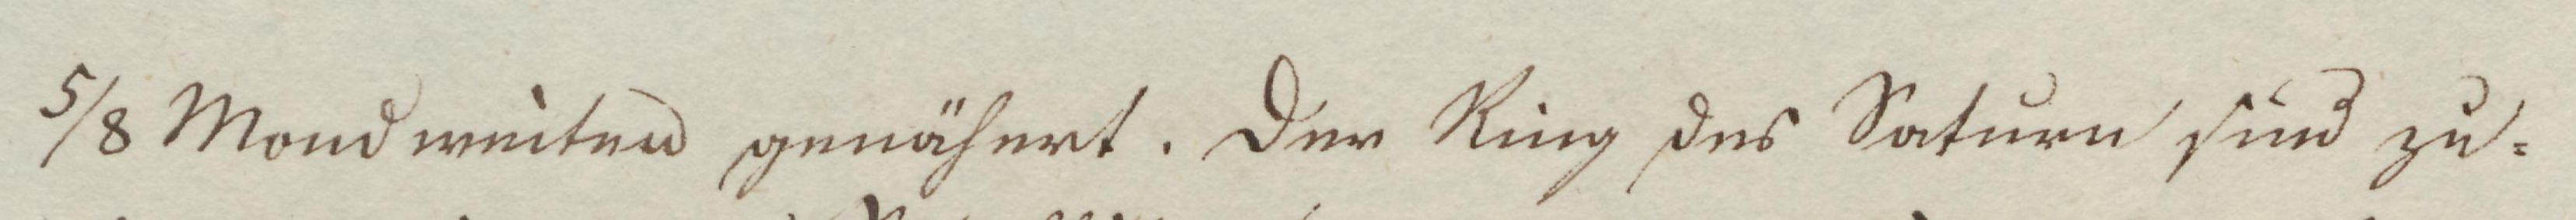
⅝ Mondweiten genähert. Der Ring des Saturn sind zu-
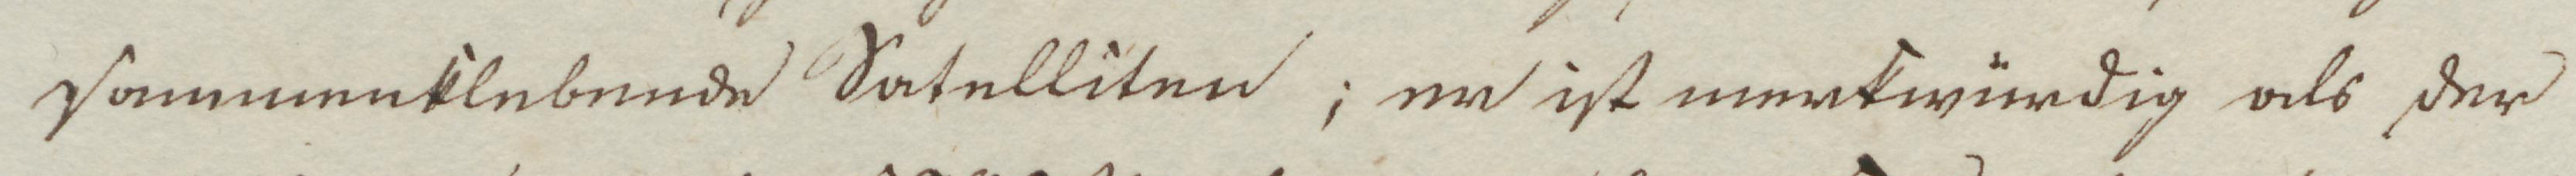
sammenklebende Satelliten; er ist merkwürdig als der
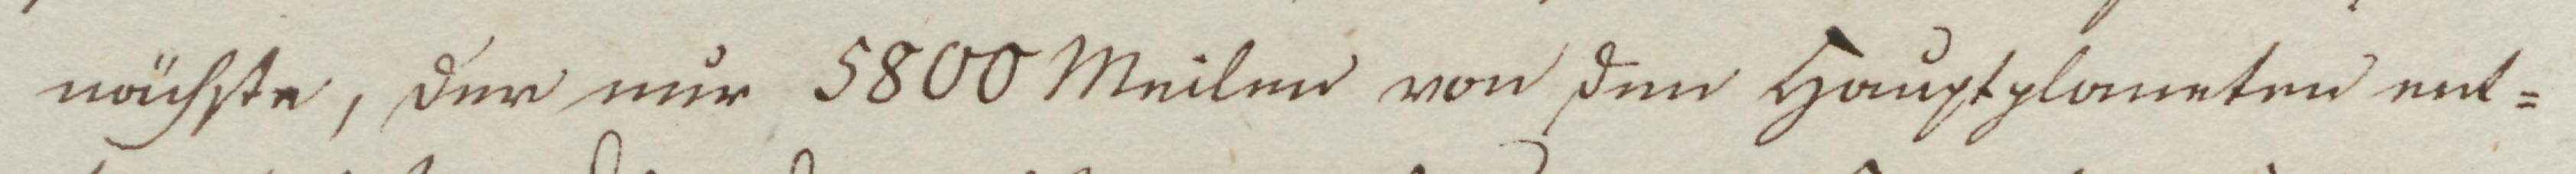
nächste, der nur 5800 Meilen von den Hauptplaneten ent-
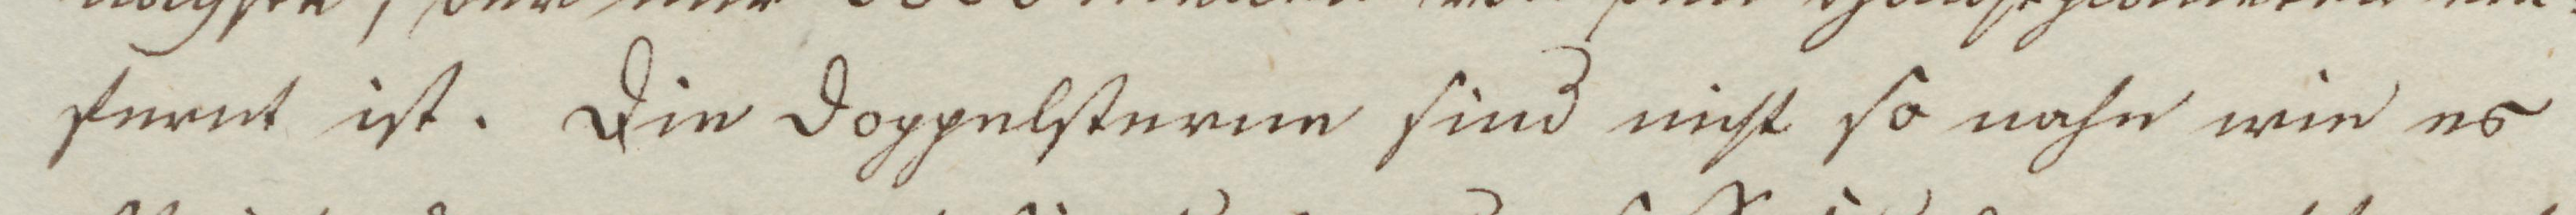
fernt ist. Die Doppelsterne sind nicht so nahe wie es
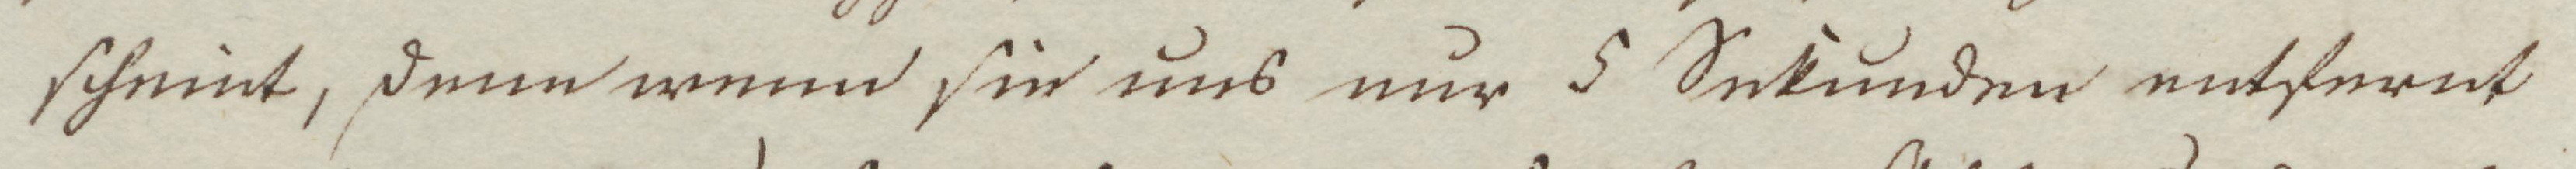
scheint, denn wenn sie uns nur 5 Sekunden entfernt
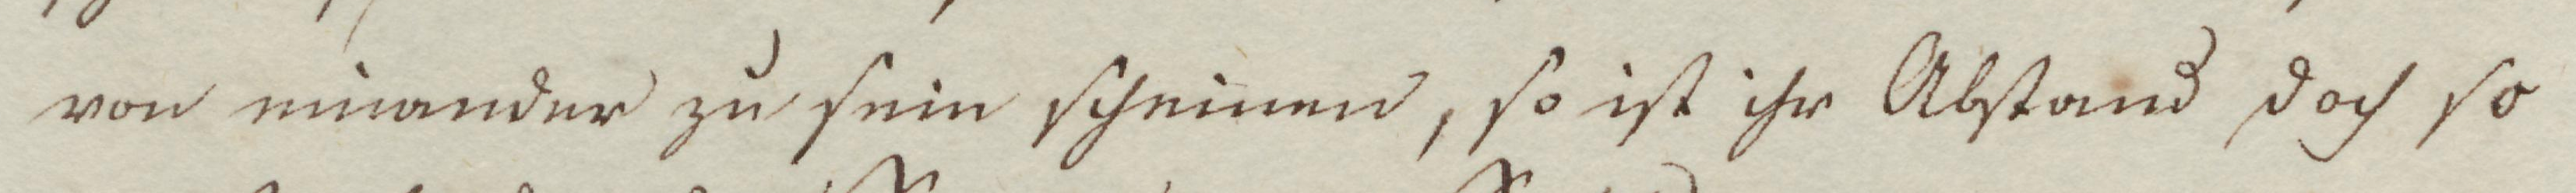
von einander zu sein scheinen, so ist ihr Abstand doch so
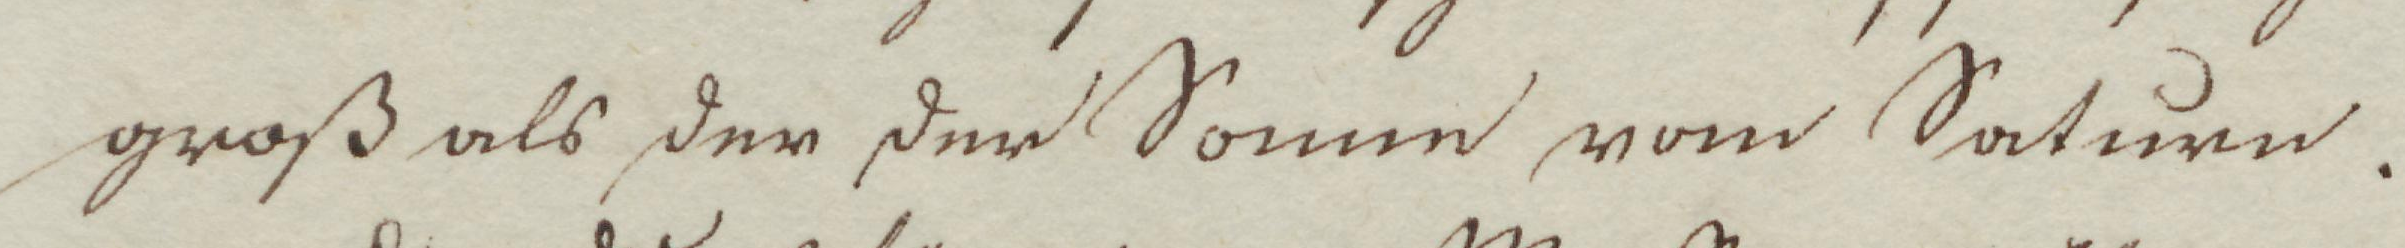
groß als der der Sonne vom Saturn.
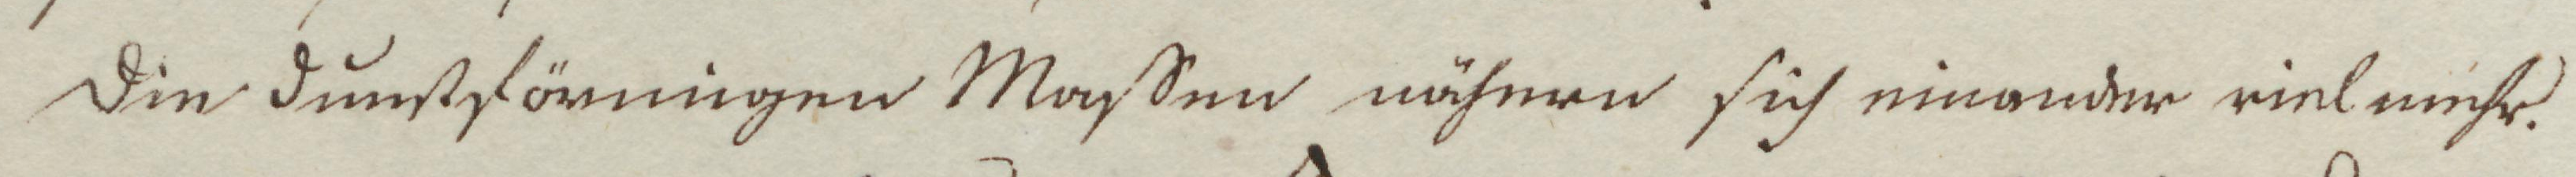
Die dunstförmigen Massen nähern sich einander viel mehr.
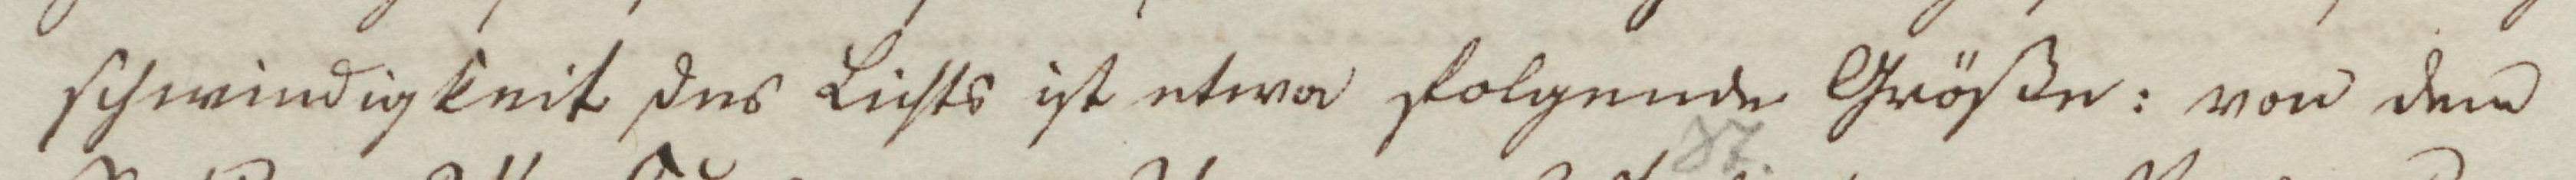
schwindigkeit des Lichts ist etwa folgende Größe: von dem
